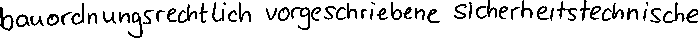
bauordnungsrechtlich vorgeschriebene sicherheitstechnische
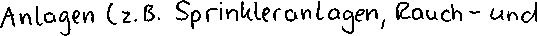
Anlagen (z.B. Sprinkleranlagen, Rauch- und
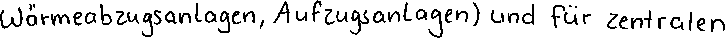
Wärmeabzugsanlagen, Aufzugsanlagen) und für zentralen
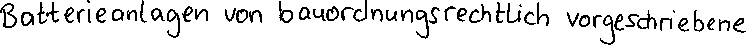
Batterieanlagen von bauordnungsrechtlich vorgeschriebene
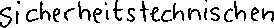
sicherheitstechnischen
